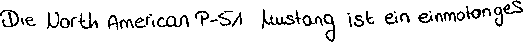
Die North American P-51 Mustang ist ein einmotoriges
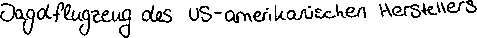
Jagdflugzeug des US-amerikanischen Herstellers
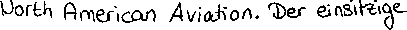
North American Aviation. Der einsitzige
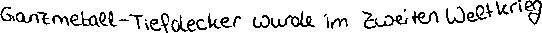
Ganzmetall-Tiefdecker wurde im Zweiten Weltkrieg
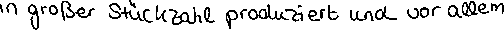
in großer Stückzahl produziert und vor allem
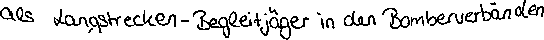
als Langstrecken-Begleitjäger in den Bomberverbänden
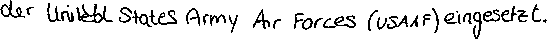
der United States Army Air Forces (USAAF) eingesetzt.
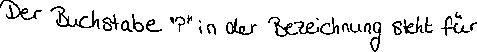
Der Buchstabe "P" in der Bezeichnung steht für
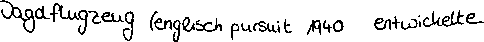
Jagdflugzeug (englisch pursuit 1940 entwickelte
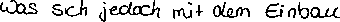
was sich jedoch mit dem Einbau
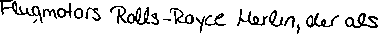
Flugmotors Rolls-Royce Merlin, der als
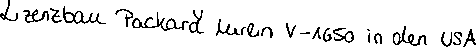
Lizenzbau Packard Merlin V-1650 in den USA
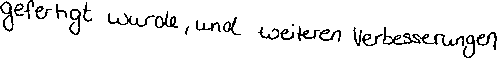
gefertigt wurde, und weiteren Verbesserungen
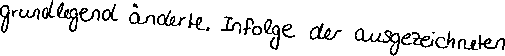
grundlegend änderte. Infolge der ausgezeichneten
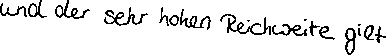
und der sehr hohen Reichweite gilt
